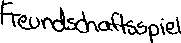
Freundschaftsspiel
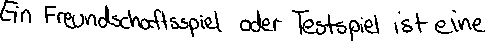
Ein Freundschaftsspiel oder Testspiel ist eine
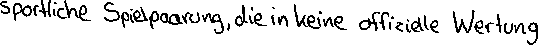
sportliche Spielpaarung, die in keine offizielle Wertung
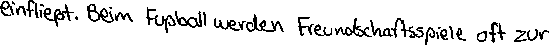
Einfließt. Beim Fußball werden Freundschaftsspiele oft zur
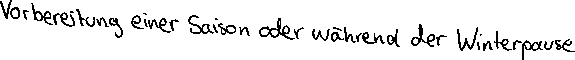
Vorbereitung einer Saison oder während der Winterpause
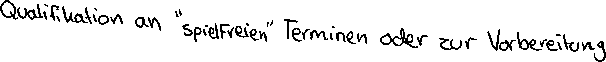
Qualifikation an "spielfreien" Terminen oder zur Vorbereitung
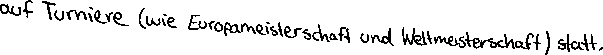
auf Turniere (wie Europameisterschaft und Weltmeisterschaft) statt.
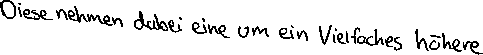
Diese nehmen dabei eine um ein Vielfaches höhere
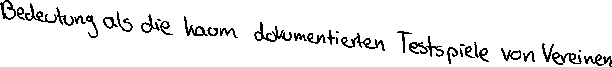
Bedeutung als die kaum dokumentierten Testspiele von Vereinen
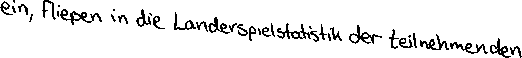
ein, fließen in die Länderspielstatistik der teilnehmenden
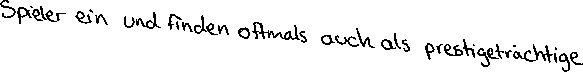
Spieler ein und finden oftmals auch als prestigeträchtige
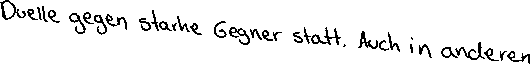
Duelle gegen starke Gegner statt. Auch in anderen
